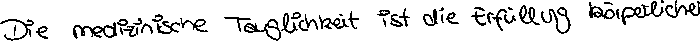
Die medizinische Tauglichkeit ist die Erfüllung körperlicher
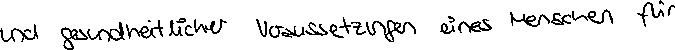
und gesundheitlicher Voraussetzungen eines Menschen für
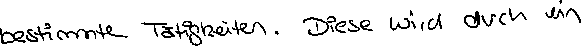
bestimmte Tätigkeiten. Diese wird durch ein
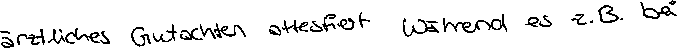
ärztliches Gutachten attestiert. Während es z. B. bei
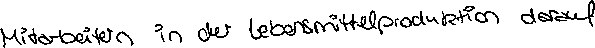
Mitarbeitern in der Lebensmittelproduktion darauf
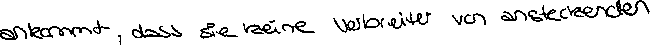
ankommt, dass sie keine Verbreiter von ansteckenden
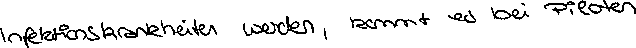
Infektionskrankheiten werden, kommt es bei Piloten
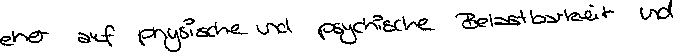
eher auf physische und psychische Belastbarkeit und
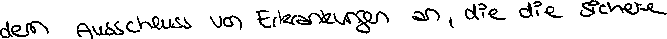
den Ausschluss von Erkrankungen an, die die sichere
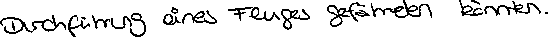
Durchführung des Fluges gefährden könnten.
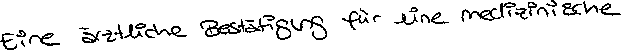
Eine ärztliche Bestätigung für eine medizinische
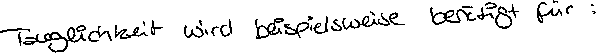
Tauglichkeit wird beispielsweise benötigt für:
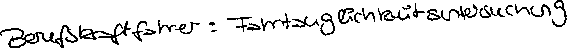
Berufskraftfahrer: Fahrtauglichkeitsuntersuchung
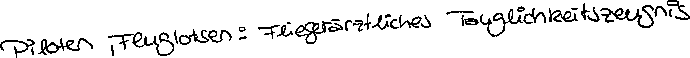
Piloten, Fluglotsen: Fliegerärztliches Tauglichkeitszeugnis
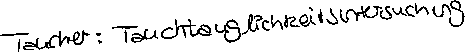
Taucher: Tauchtauglichkeitsuntersuchung
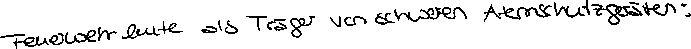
Feuerwehrleute als Träger von schweren Atemschutzgeräten:
